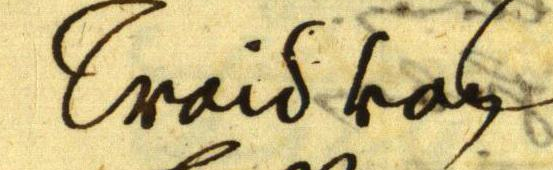Traid von
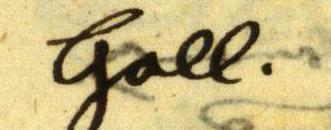Hall.
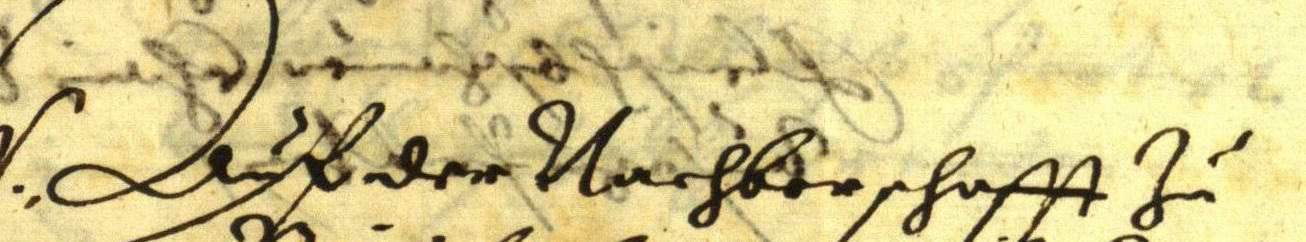Aūf der Nachberschafft Zū
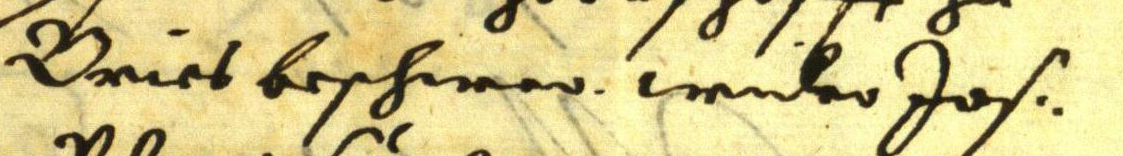Gries beschwer. wider Jos¬
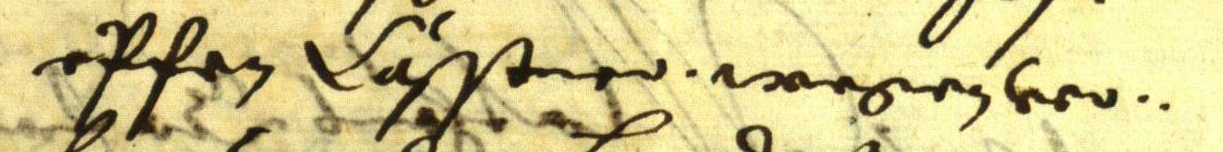effen Cāsstner. wegen ver¬
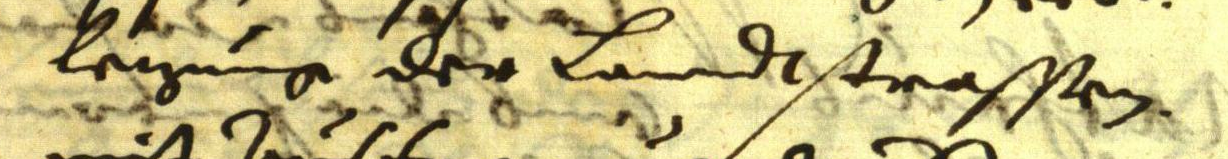lezūng der Landtstrassen.
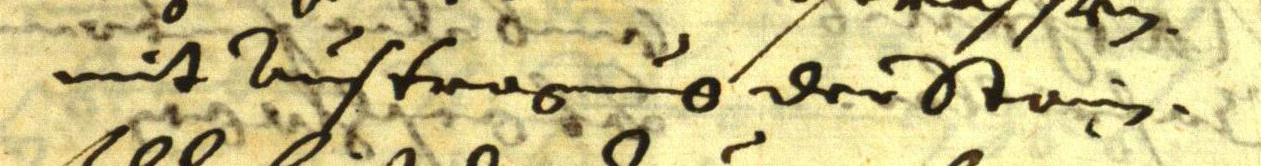mit Aūstragūng der Stain.
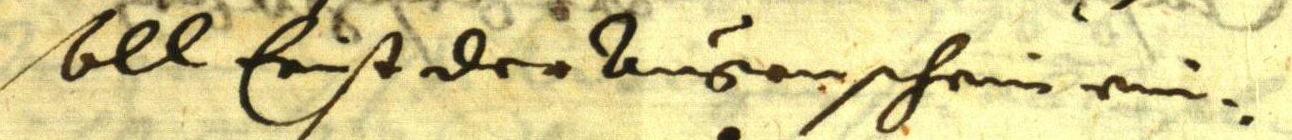soll Eeist der Aūgenschein ein¬
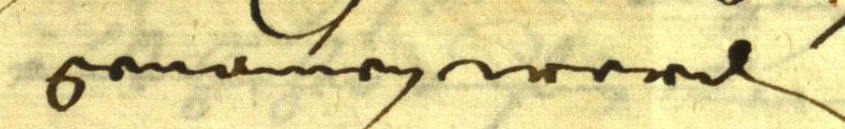genomen werd.
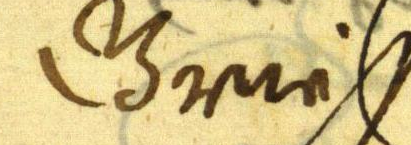Griess¬
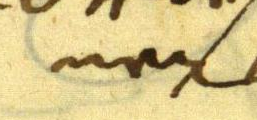ner.
